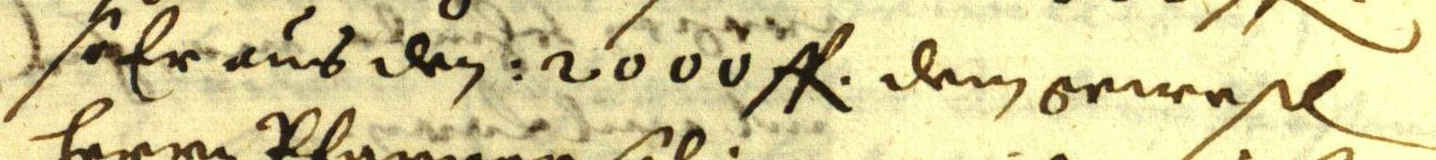so Er aūs den: 2000 fl. dem gewest
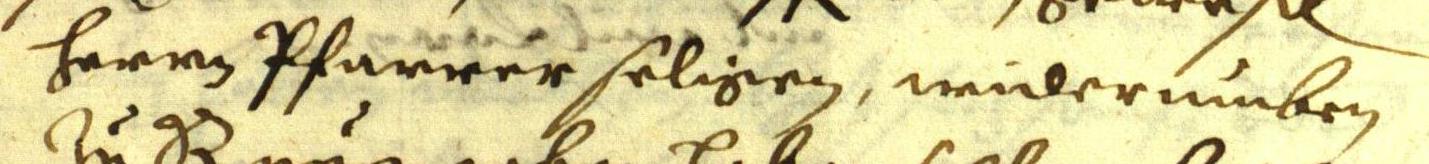herrn Pfarrer seligen widerūmben
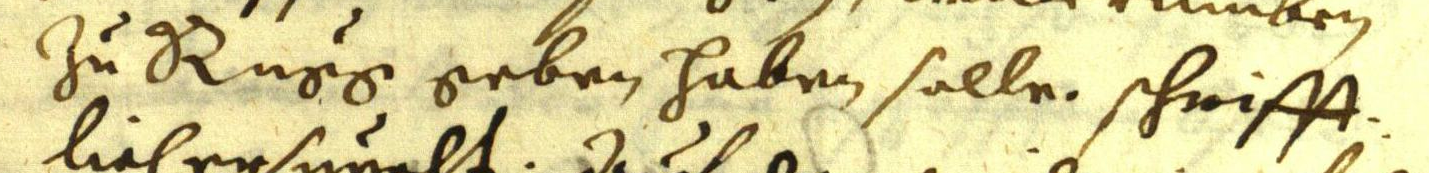Zū Rūgg geben haben solle. schrifft¬
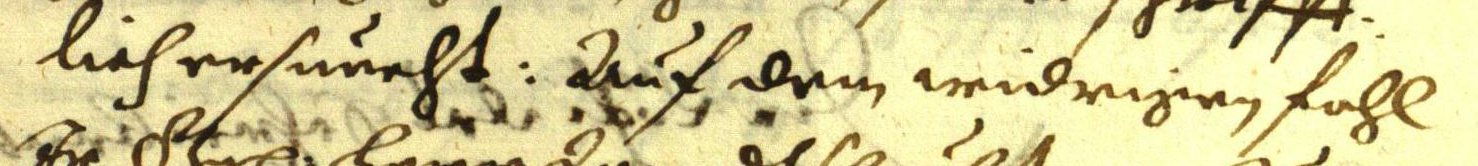lich ersūecht: Aūf dem widrigen fahl,
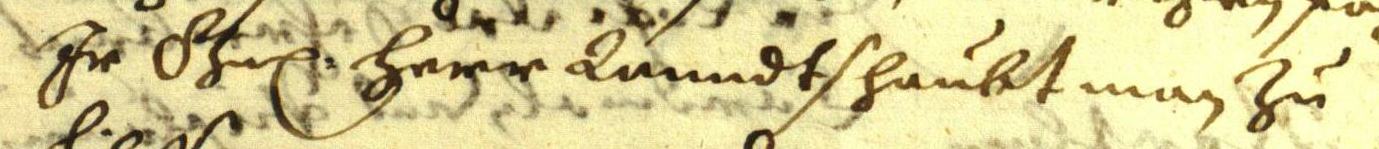Ir Gn: Herr Lanndtshaūbtman Zū
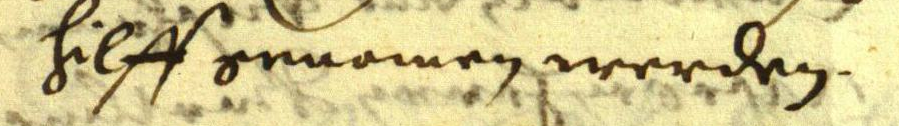hilff genomen werden.
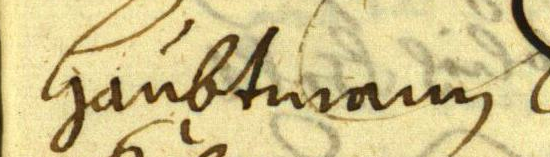Haūbtmann
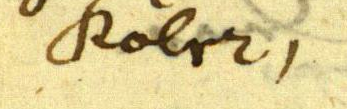Kōler,
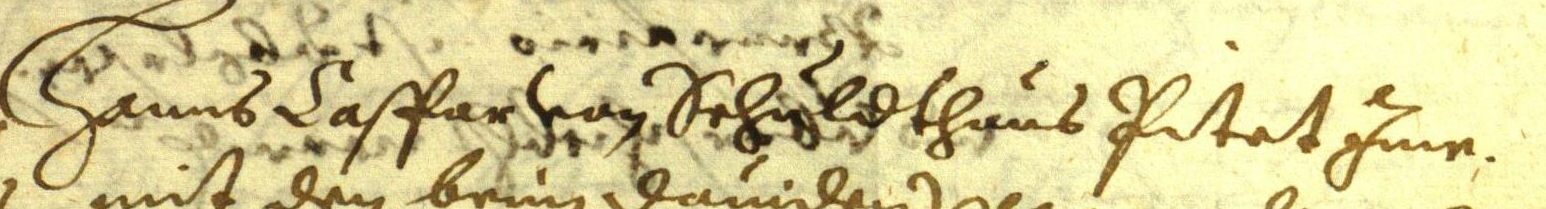Hanns Caspar von Schūldthaūs Pitet Ime.
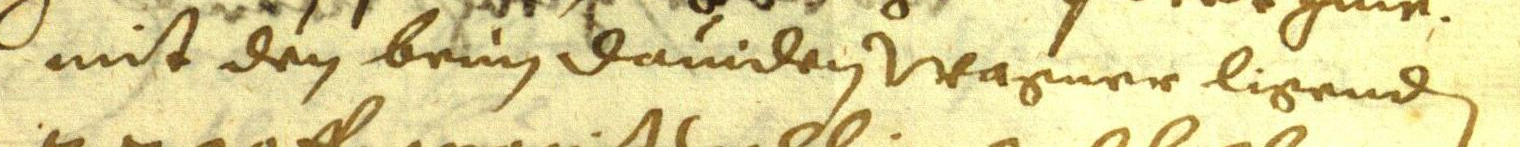mit den beim daūiden Wagner ligend
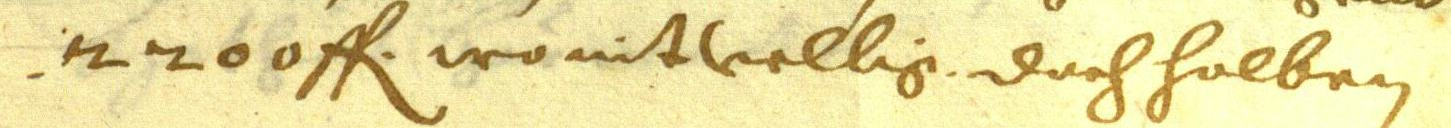.2200 fl. wo nit vellig. doch halben
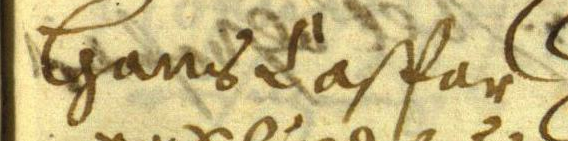Hans Caspar
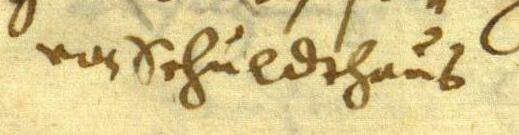von Schūldthaūs
